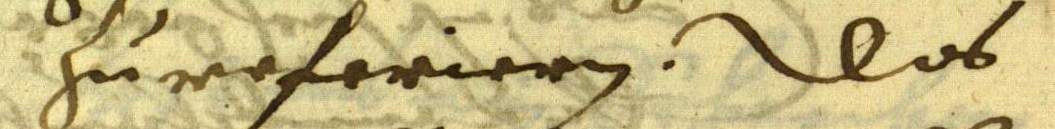Zū referiern. das
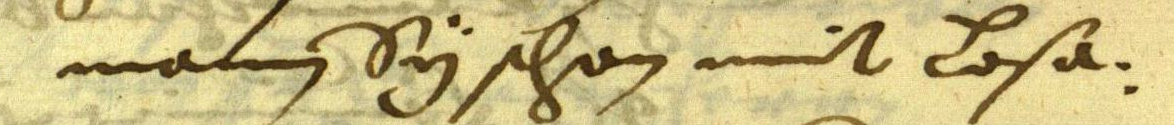mann Sÿ schon mit Losa¬
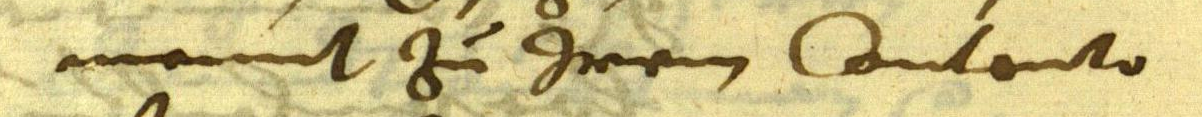mennt Zū Irem Contento
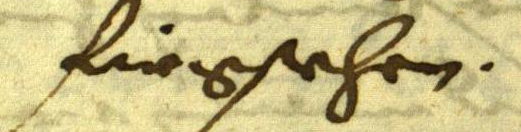firgsehen.
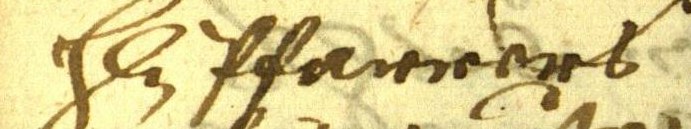hn Pfarrers
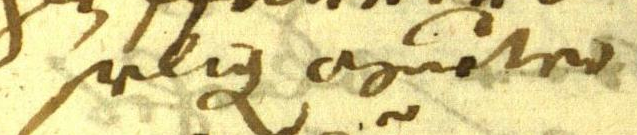selig Mūeter
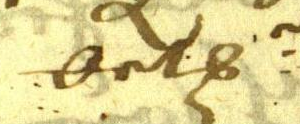bet:
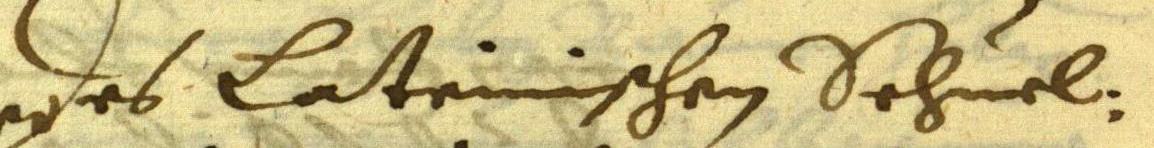Des Lateinischen Schūel¬
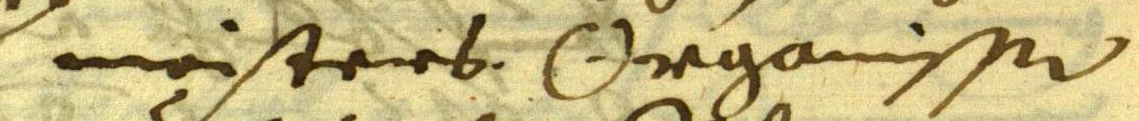Maisters. Organisst
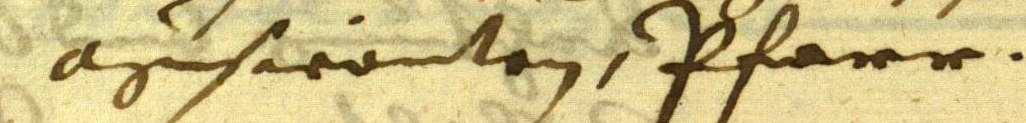Mūsicanten, Pfarr¬
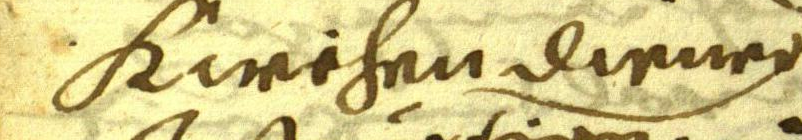Kirchen diener
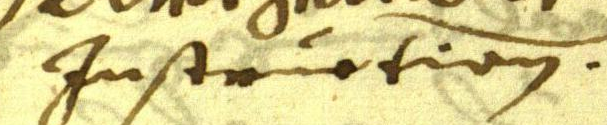Instrūction.
